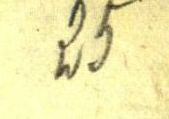25
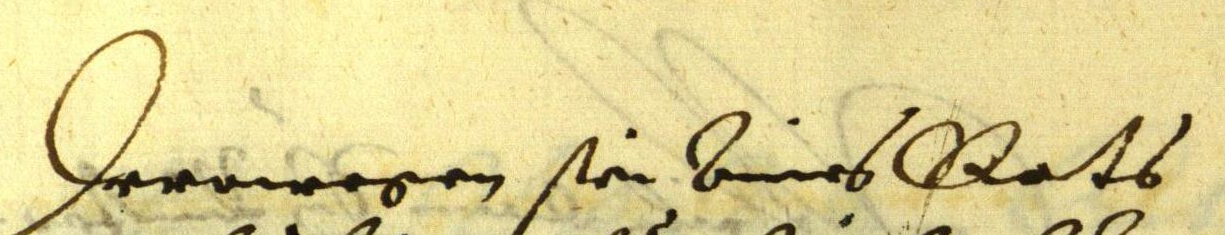Derowegen sein Aines Rats
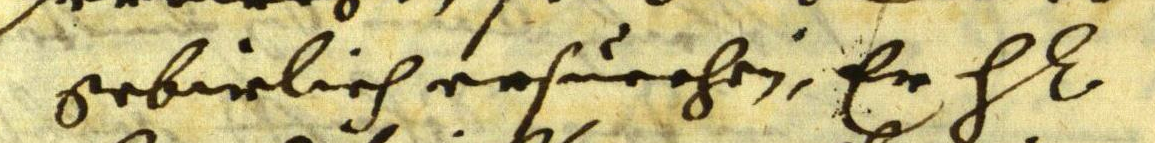gebirlich ersūechen, Er hl.
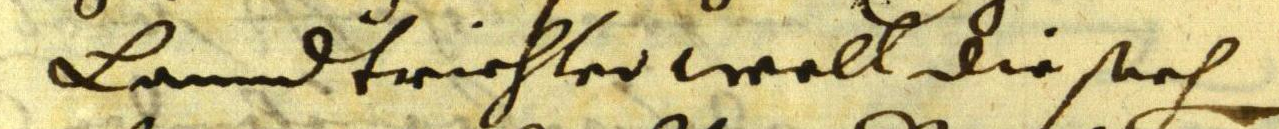Lanndtrichter well die sach
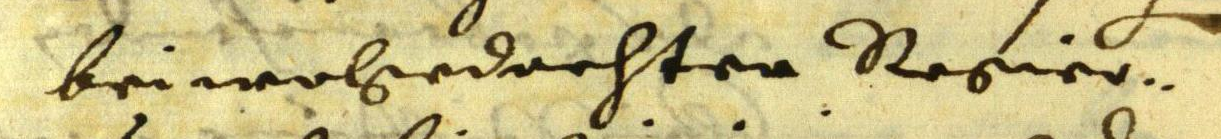bei wolgedachter Regier¬
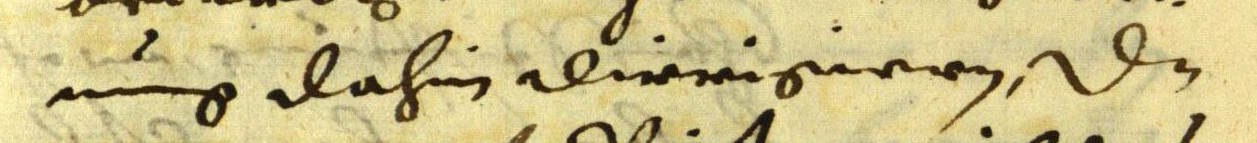ūng dahin dirrigieren, den
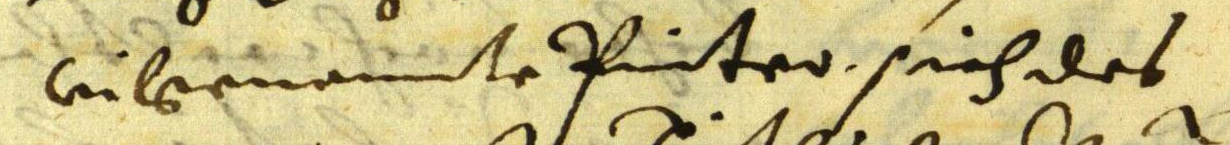vilgenannte Pinter. sich des
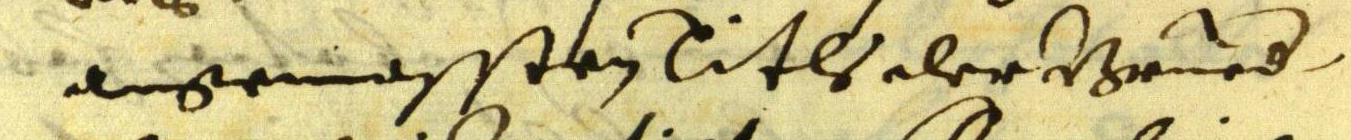angemassten Titls aber Brūed¬
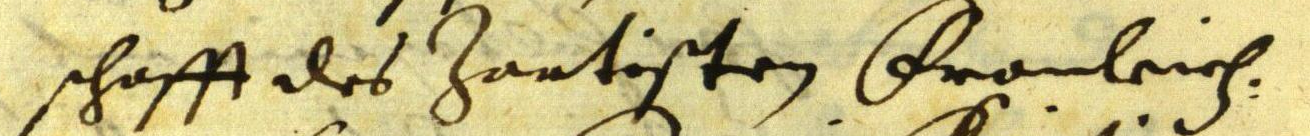schafft des Zartisten Fronleich¬
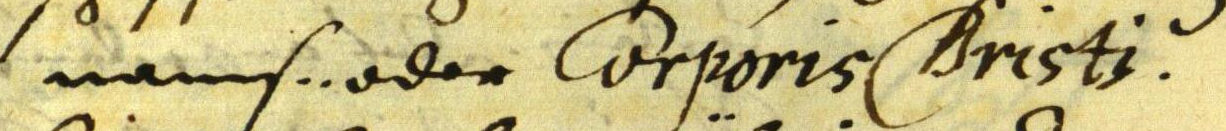nams: oder Corporis Cristi.
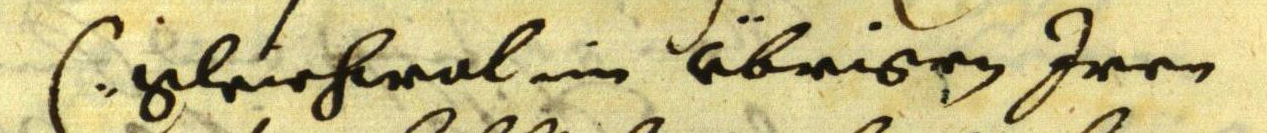(:gleichwol im v̈brigen Iren
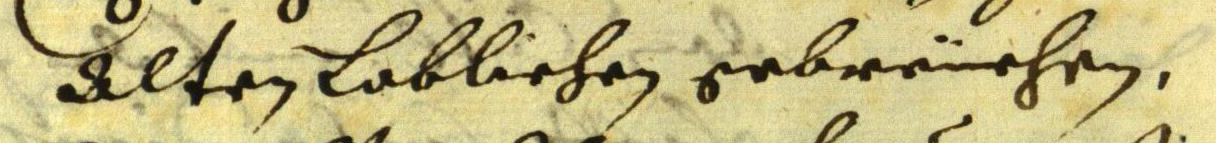Alten Loblichen gebreüchen,
